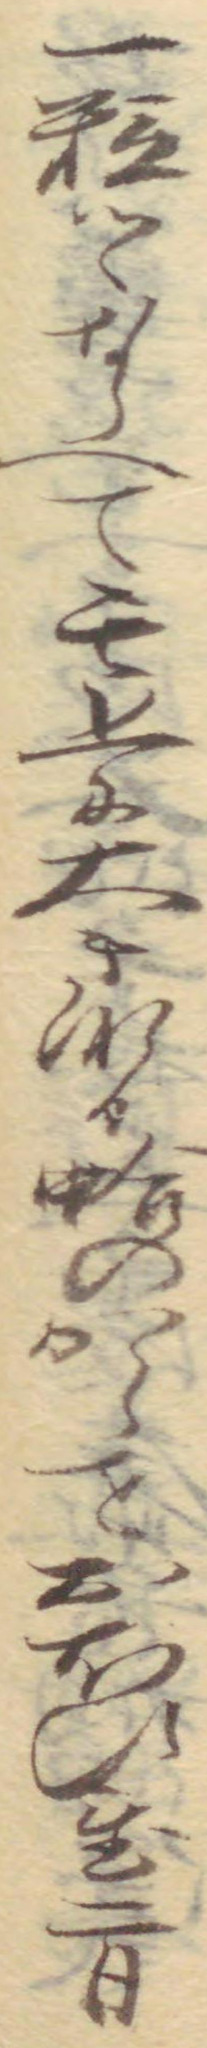一粒ツヽならへて其上に大きなる蛤のからをおほひ置二月
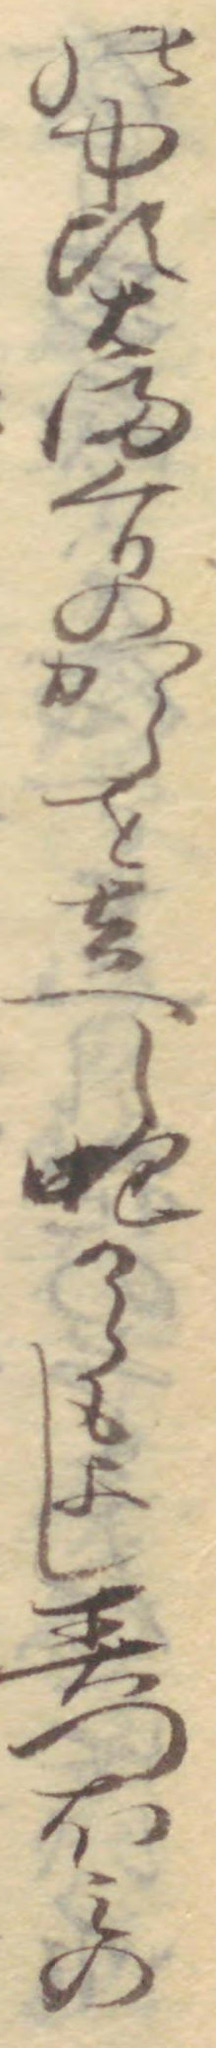の中頃はまくりのからを去へし蚫のからもよし春つほミの
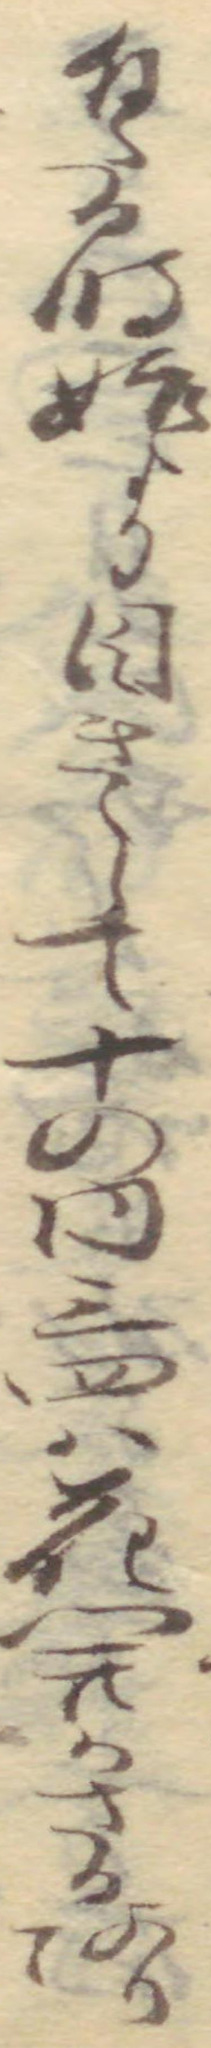付たる時始より目きゝして十の内三四ハ花開かさるあり
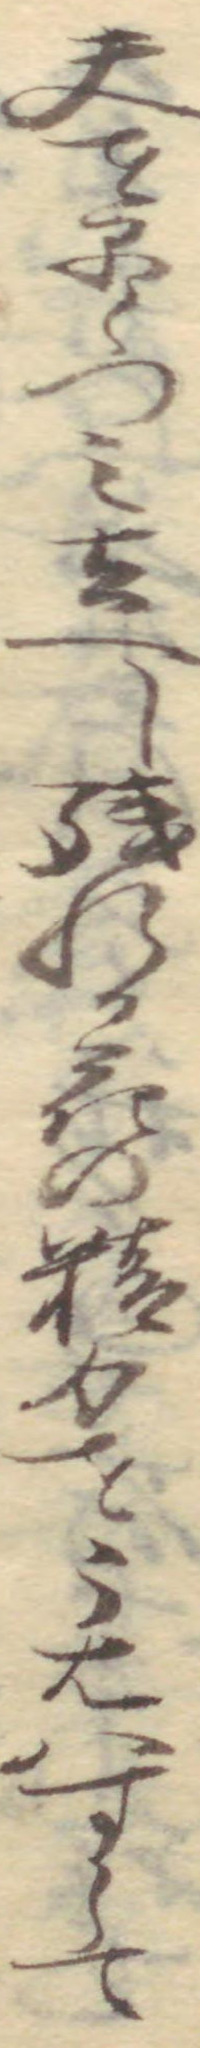夫をはやくつミ去へし残れる花の勢力をうはハすして
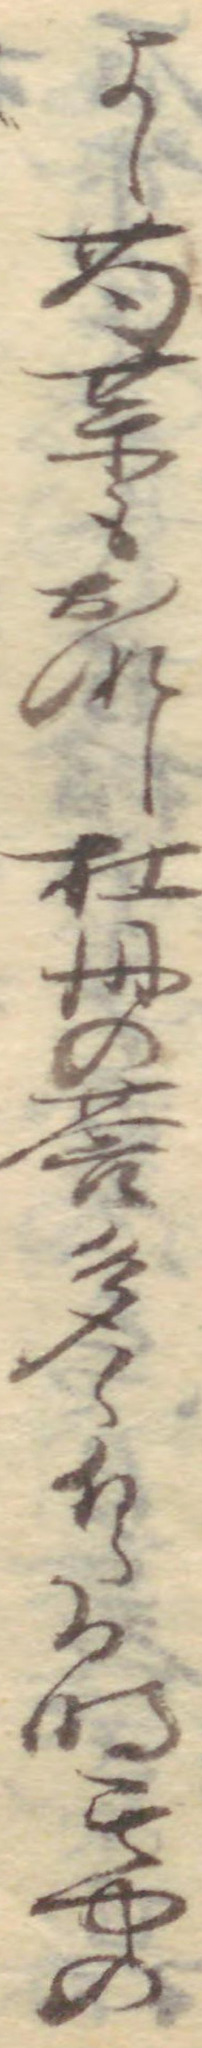よし芍薬もおなし牡丹の莟多く付たる時其中の
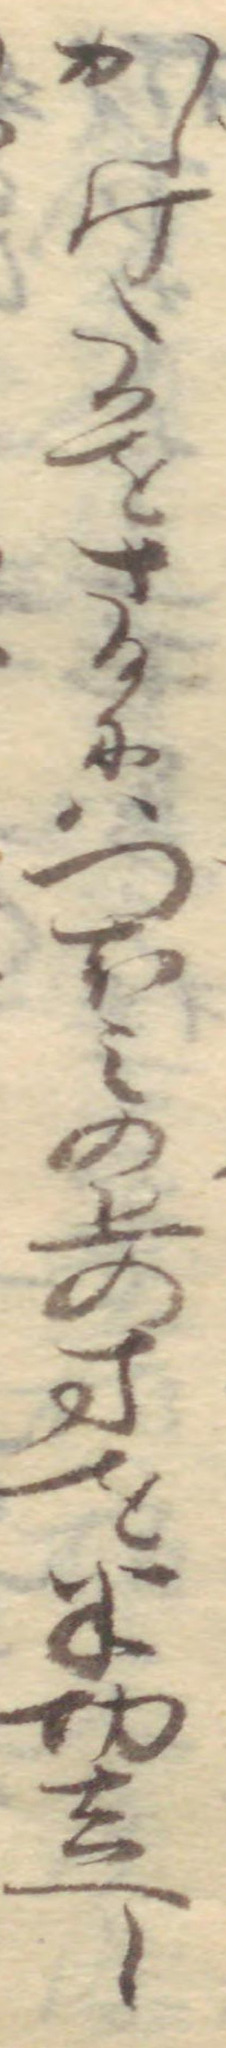かしけたるを去るにハつほミの上の方を半切去へし
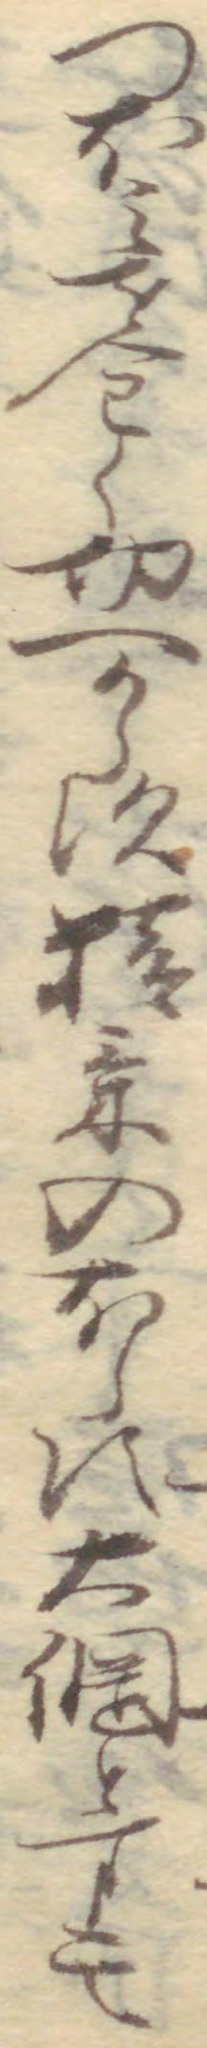つほミを全く切へからす精気のほらす大網とす其
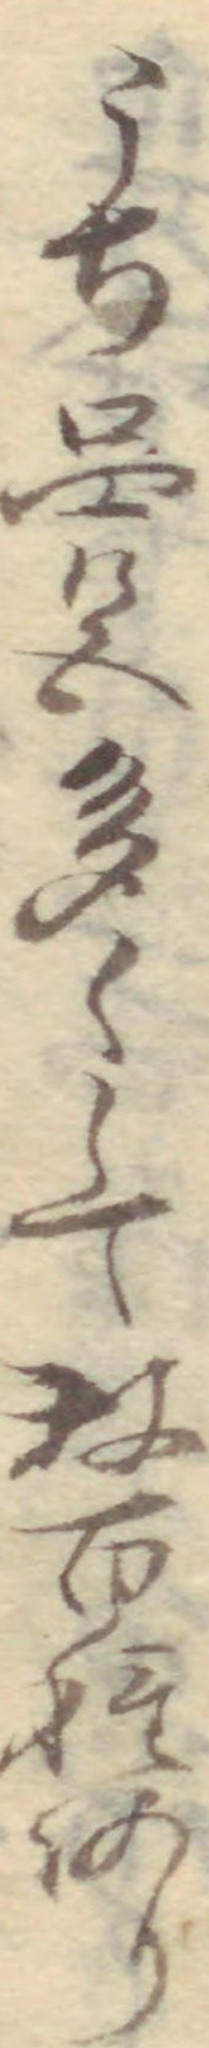うち品色多くして数百種あり
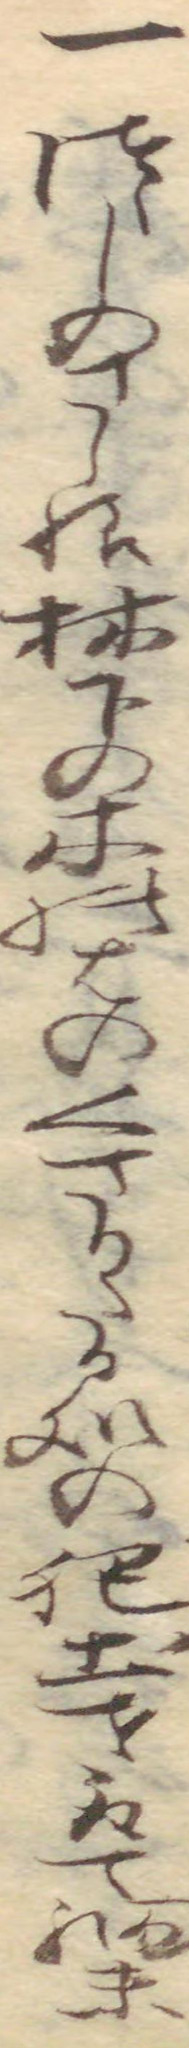一つゝしのさし様林下の木のはのくさりたる処の肥土を取て細末
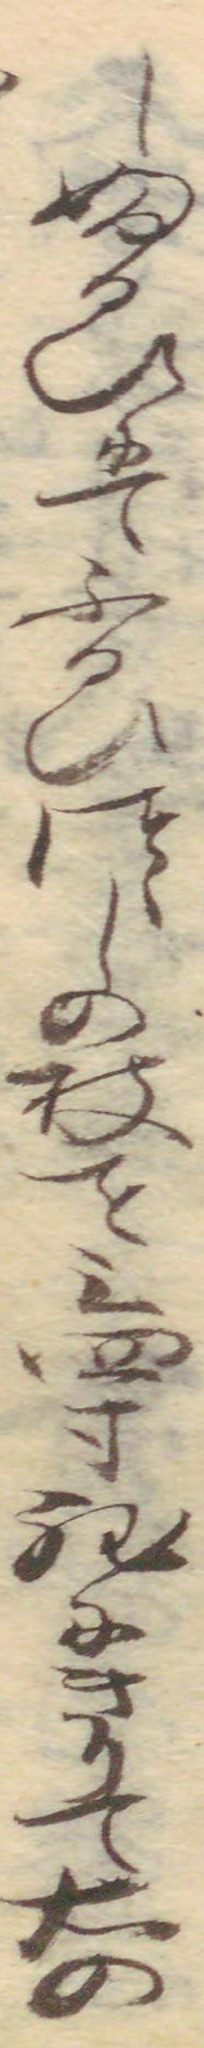しふるひにてふるひつゝしの枝を三四寸程にきりて右の
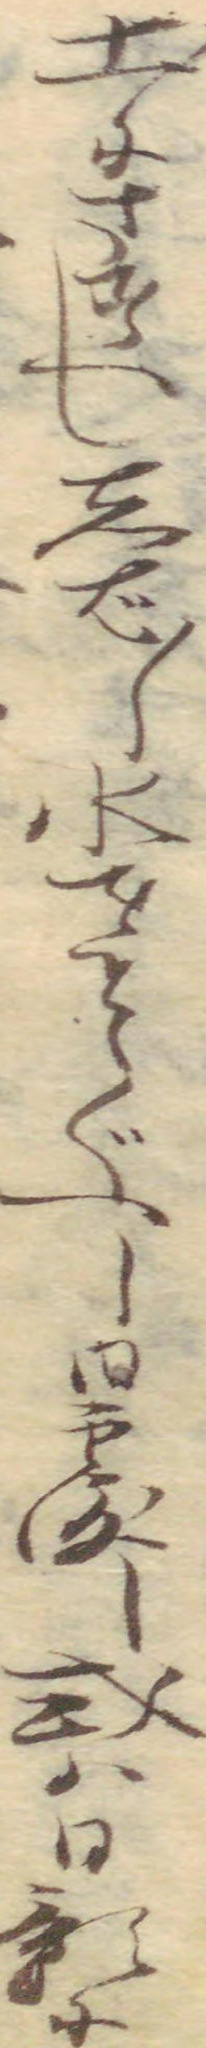土にさすへししば〳〵水をそゝぐべし日覆し或ハ日影に
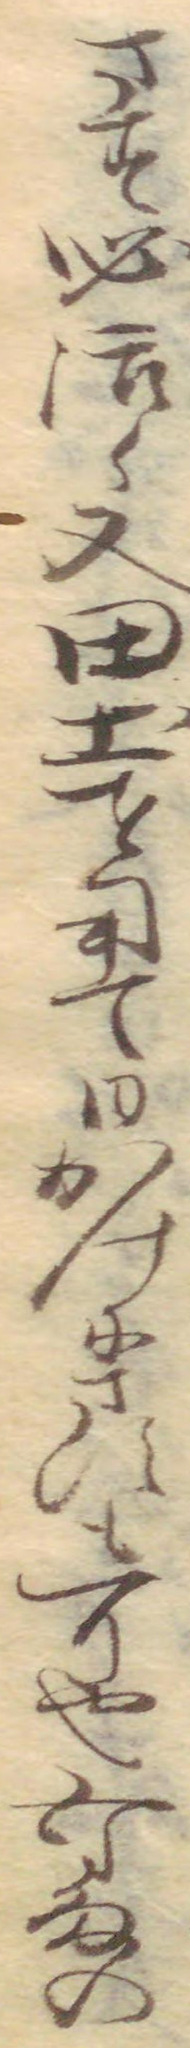さす必活く又田土を用て日かけにさすも可也五月雨の

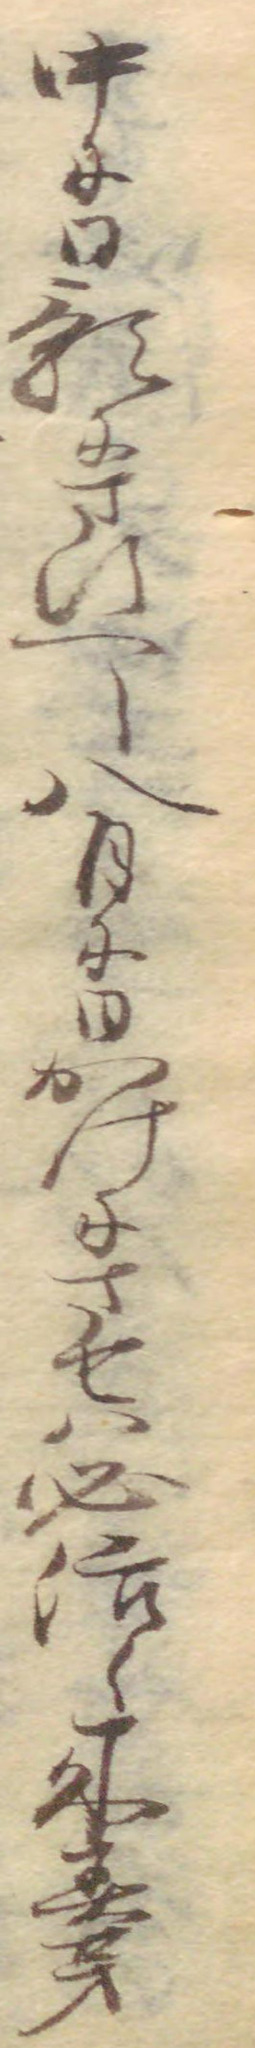中に日影にさすへし八月に日かけにさせハ必活く来春芽
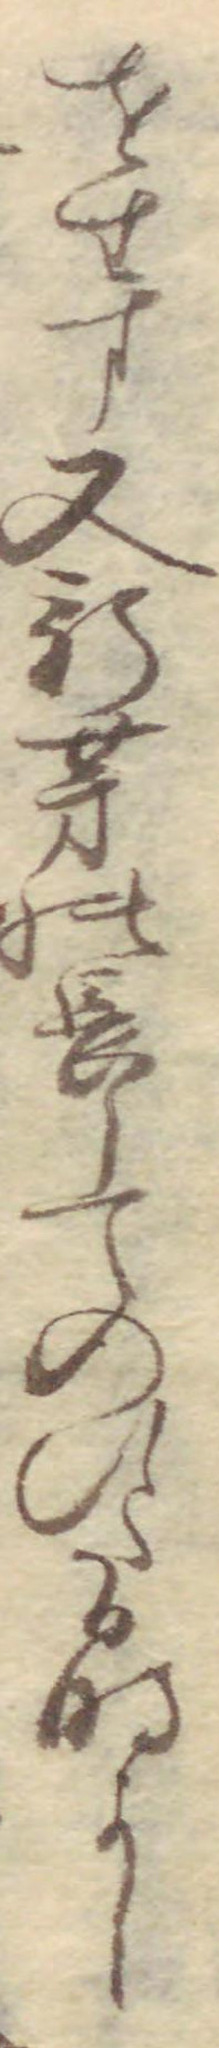を生す又新芽の長してのひたる時よし
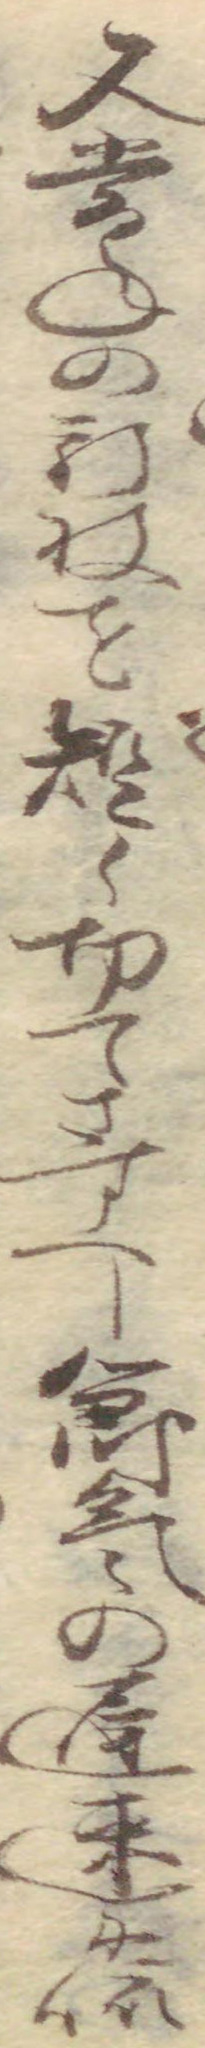又当年の新枝を短く切てさすへし節気の遅速に依
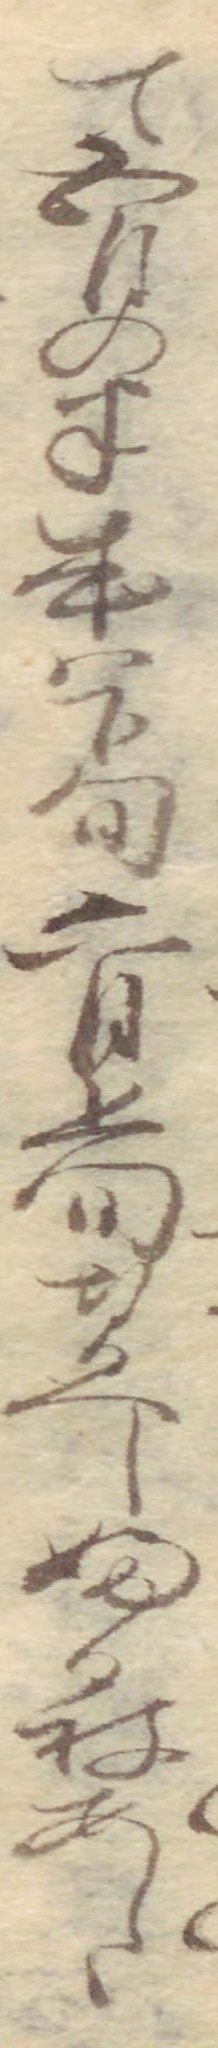て五月の半或は下旬六月上旬なるへしふる枝あし也
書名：鶯宿雑記. 巻199-200
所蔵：国立国会図書館 National Diet Library, JAPAN
